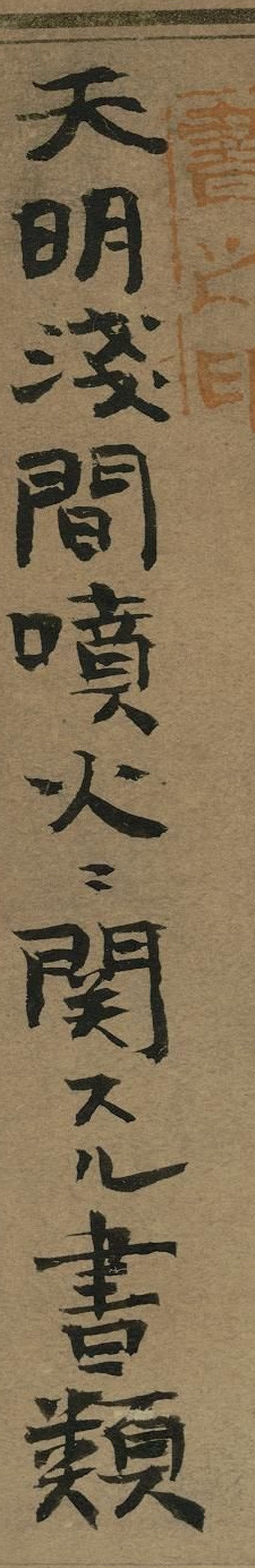天明浅間噴火ニ関スル書類

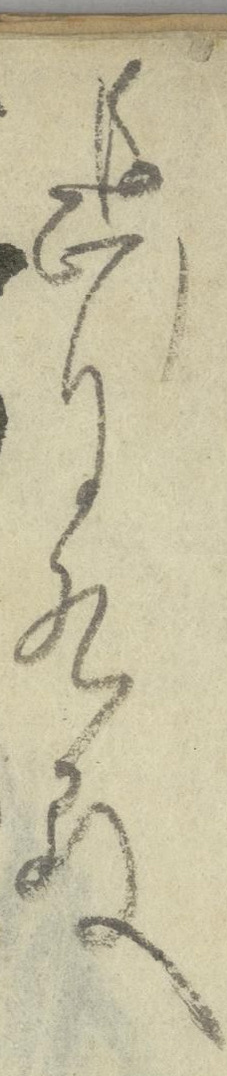従正月九日
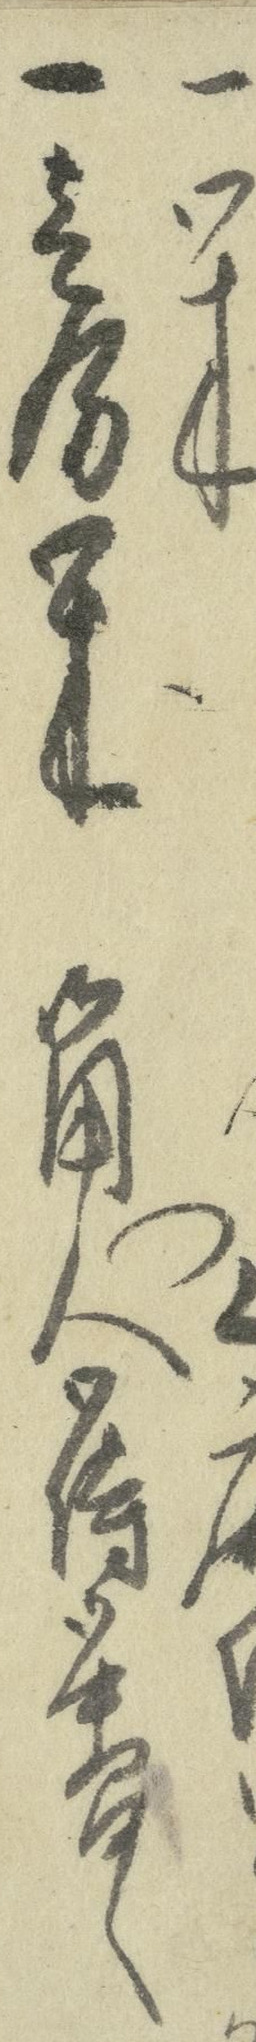一壱分弐朱御用人御侍御中間へ
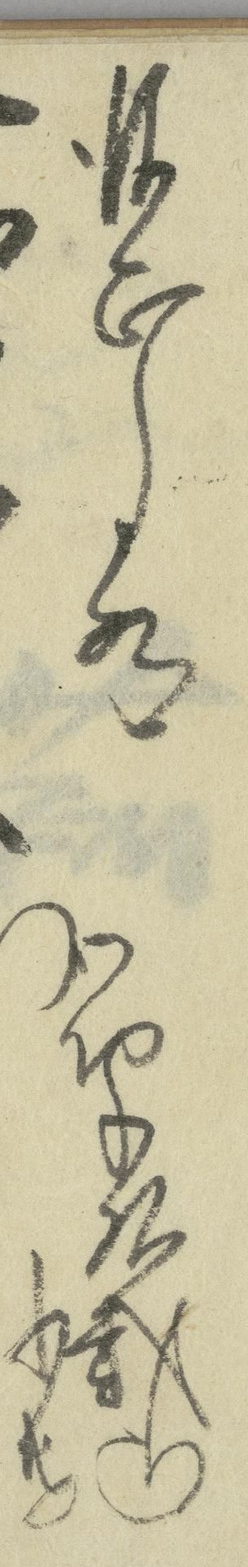従正月九日
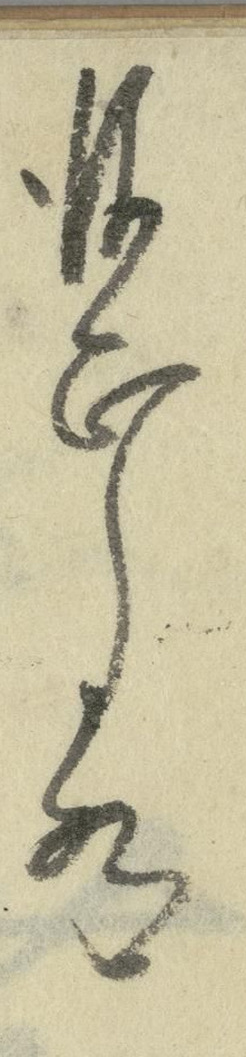従正月九日
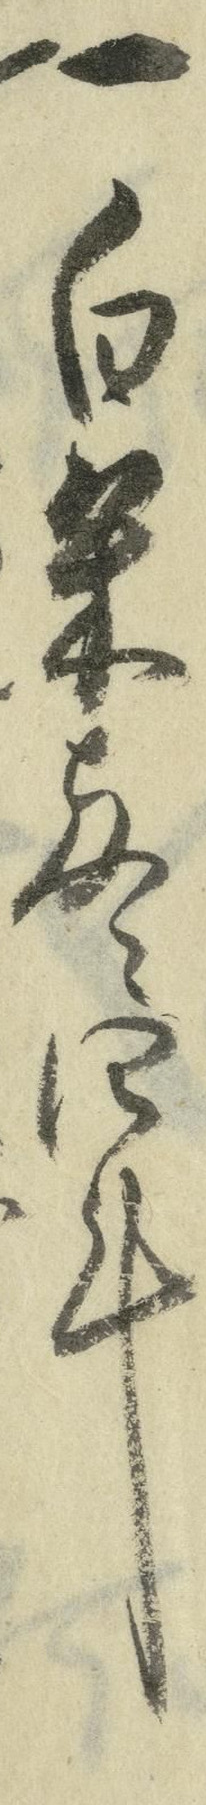一白米両二四斗
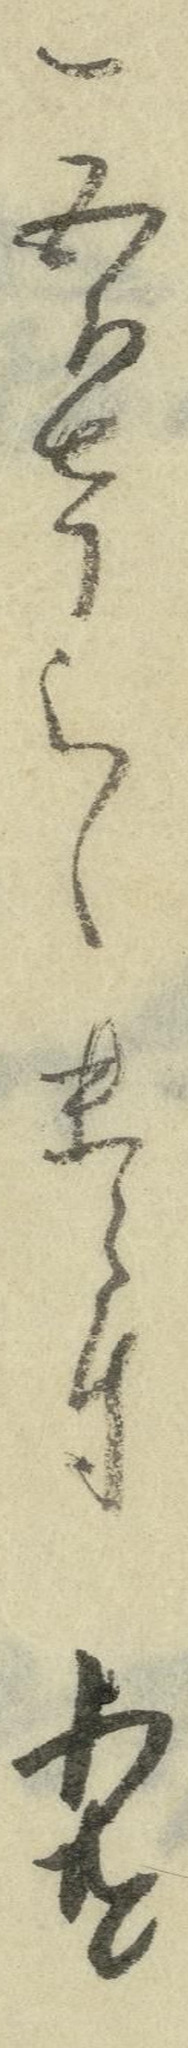一五百七十三文未二付小遣

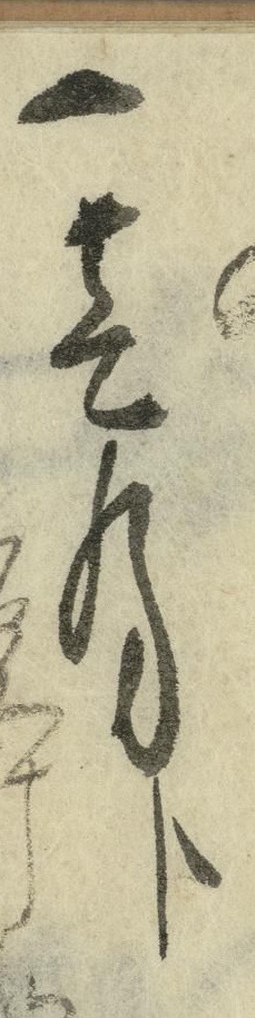一壱分ト
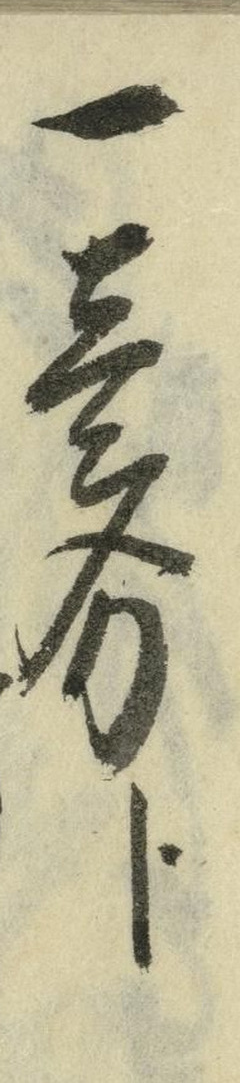一壱分ト
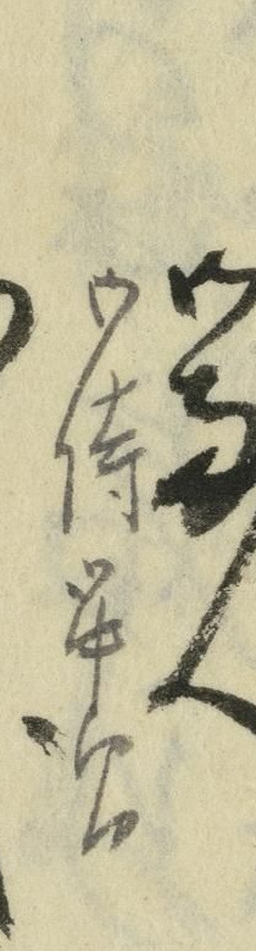御侍御中間
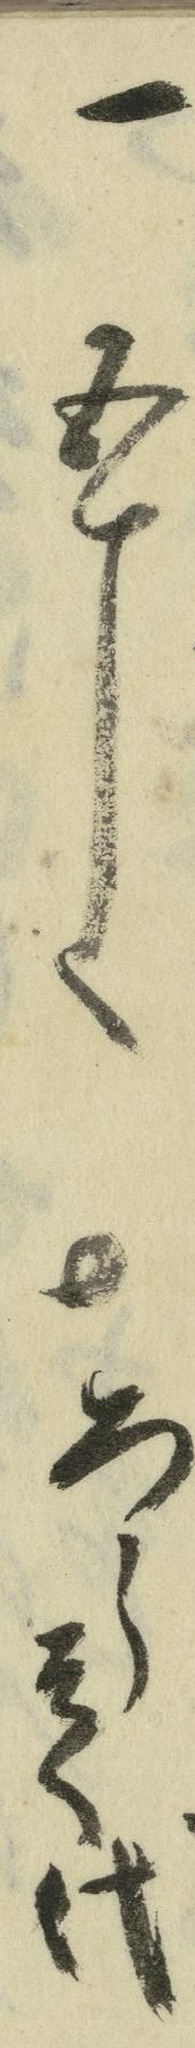一五十文ろうそく代
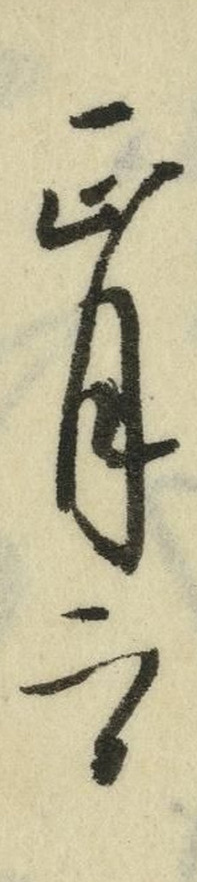正月二日
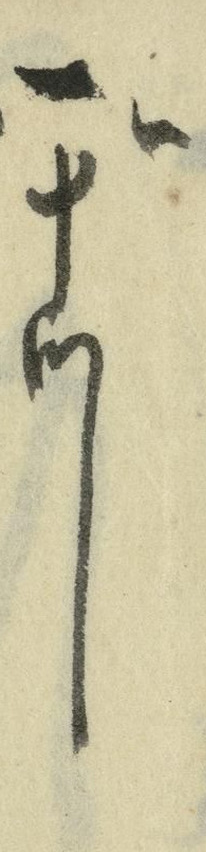一十六文
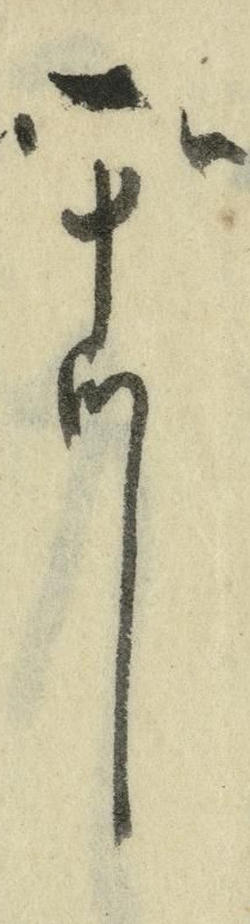一十六文
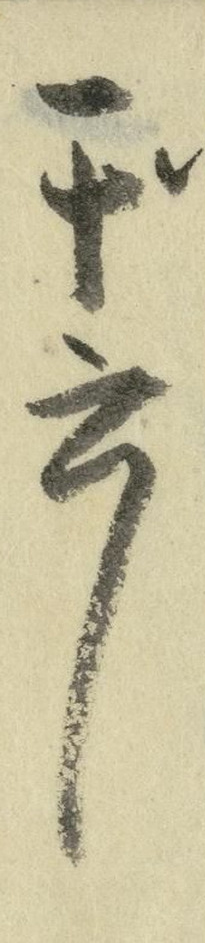一十六文
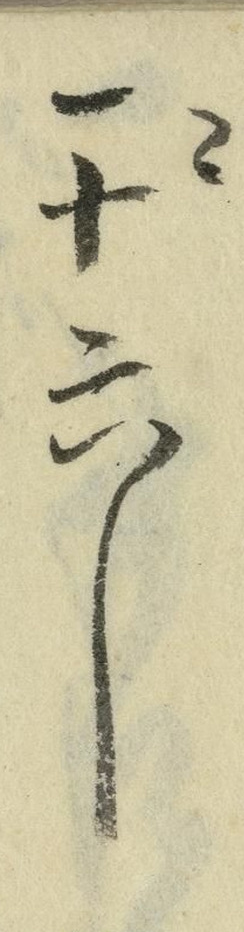一十六文
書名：天明淺間噴火ニ関スル書類
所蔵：東京大学地震研究所図書室 Earthquake Research Institute Library, The University of Tokyo, JAPAN
